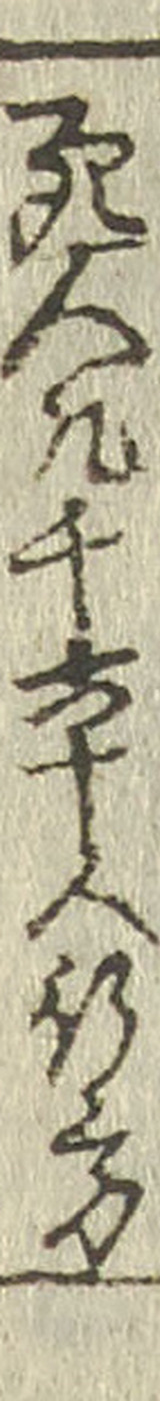死人凢千六十人行方
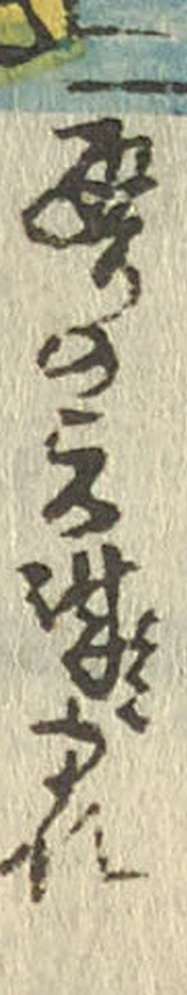通りのこる誠にまれ
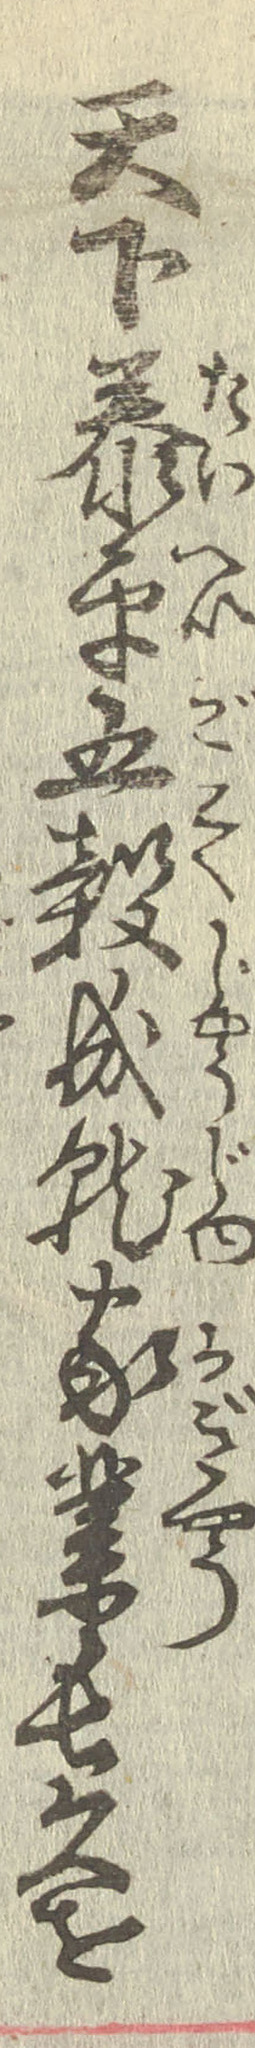天下泰平五穀成就家業長久を
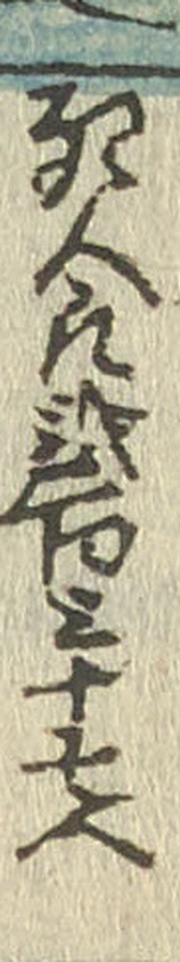死人凡弐百三十七人
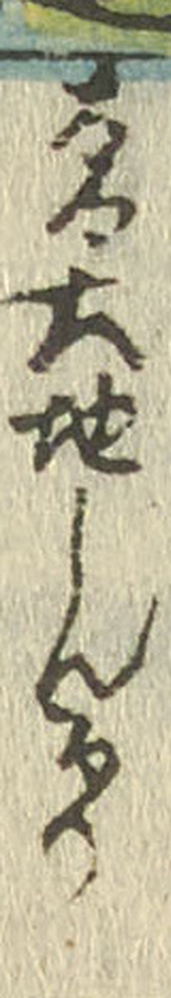なる大地しんなり
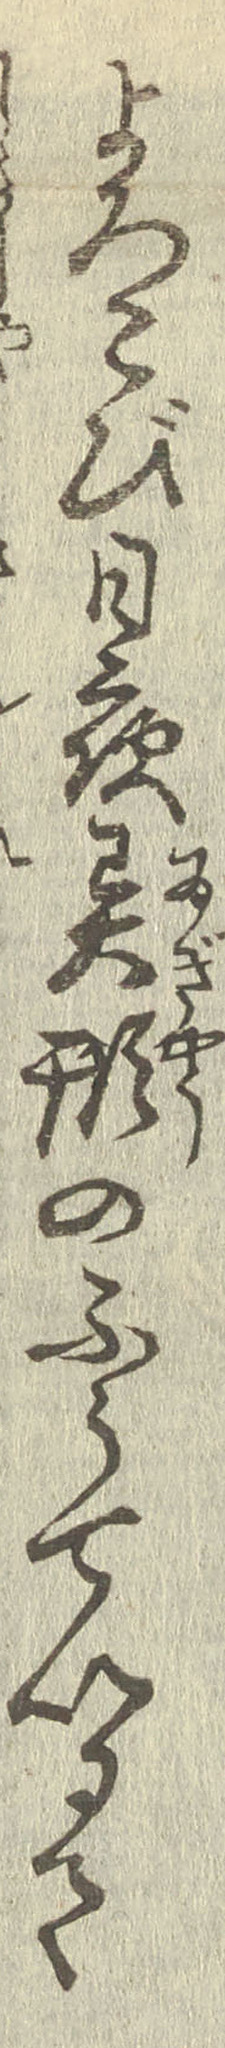よろこび日夜異形のふうていにて
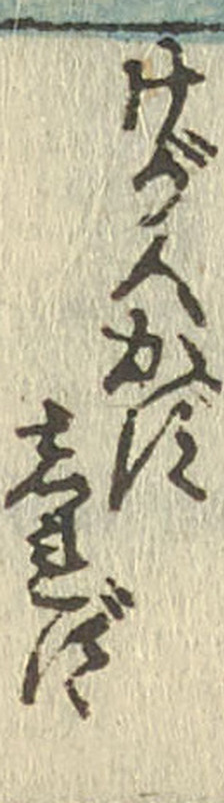けが人かずしれず
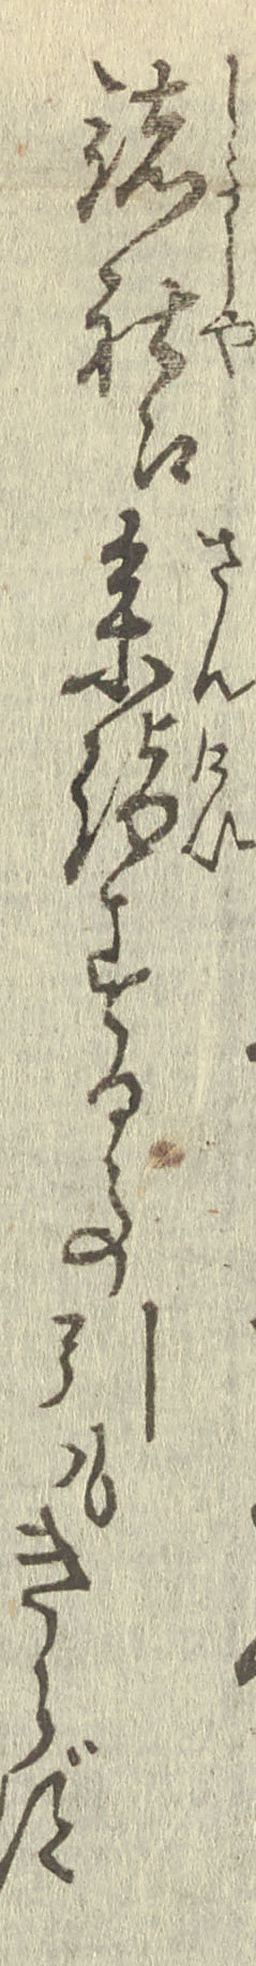諸社え参詣する事引もきらず
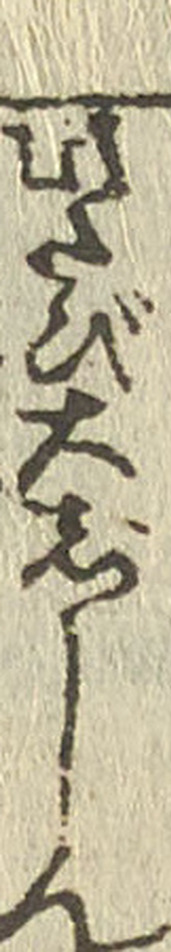此たび大じしん
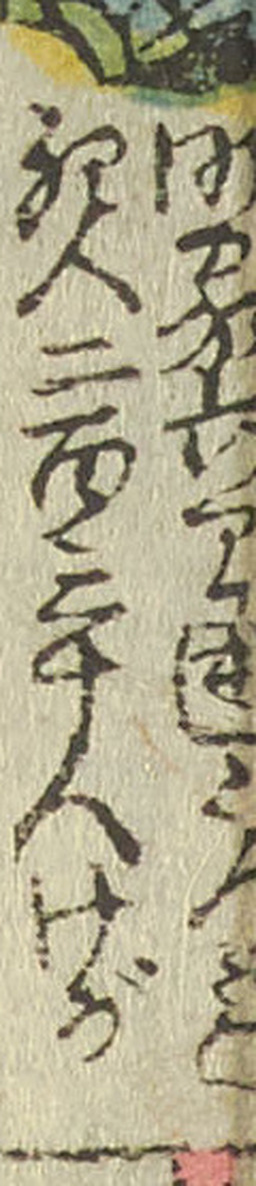死人三百三十人けが
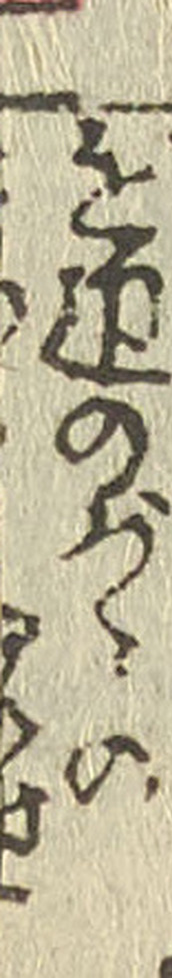近辺の村〻の
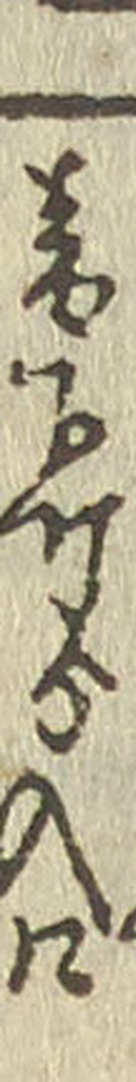音下町ゟ入口
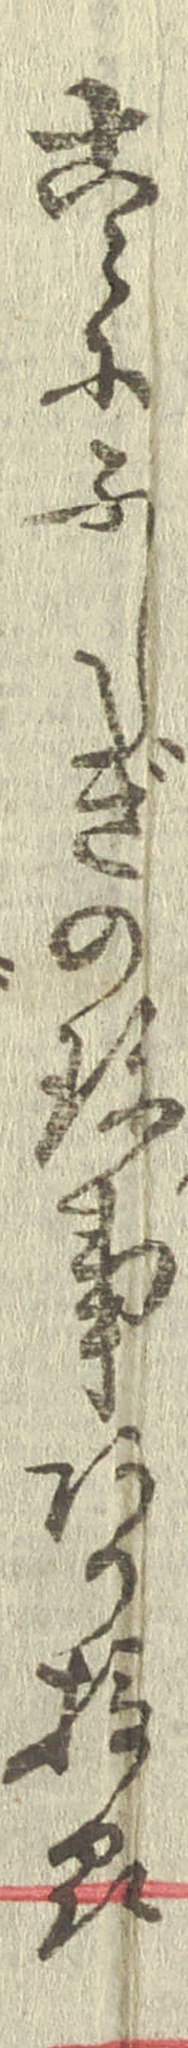こゝにふしぎの珍事あり摂州
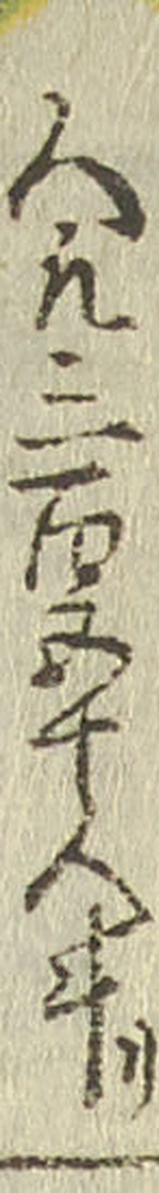人凢三百五十人斗り
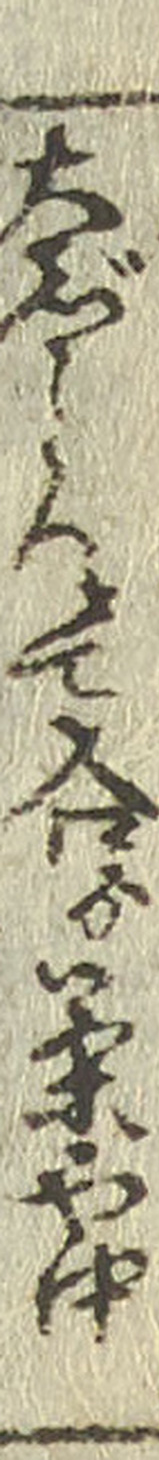大じしんニて入江ゟ茶屋中
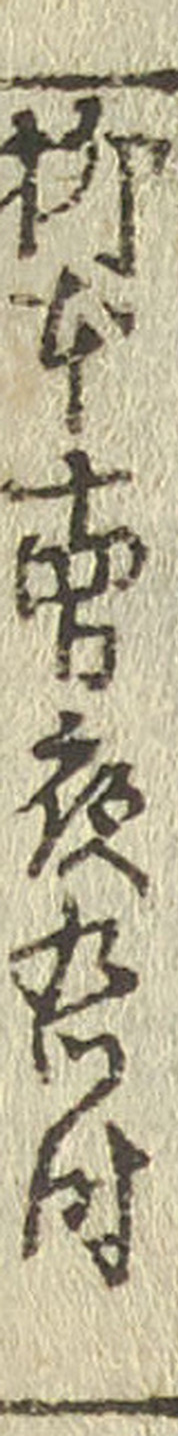柳本十四日夜九ツ時
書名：大地震早引方角附
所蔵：東京大学総合図書館 General Library in the University of Tokyo, JAPAN
